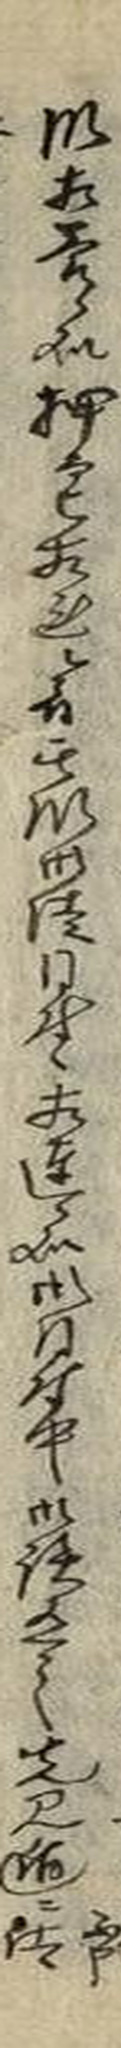段相答候処押而被相通候に付其段御徒目付へ相達候処御目付中御談有之先見遁に仕候
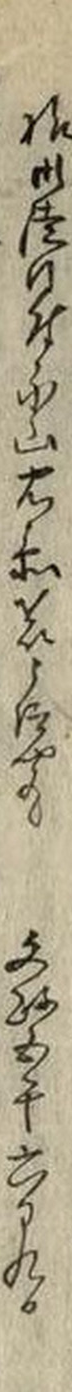様御徒目付永山忠兵衛を以被仰聞候文政五午六月九日当番
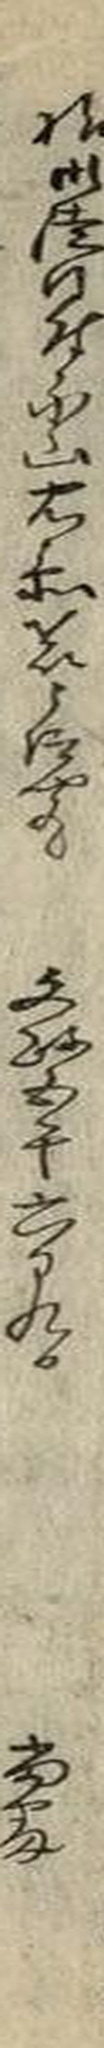様御徒目付永山忠兵衛を以被仰聞候文政五午六月九日当番
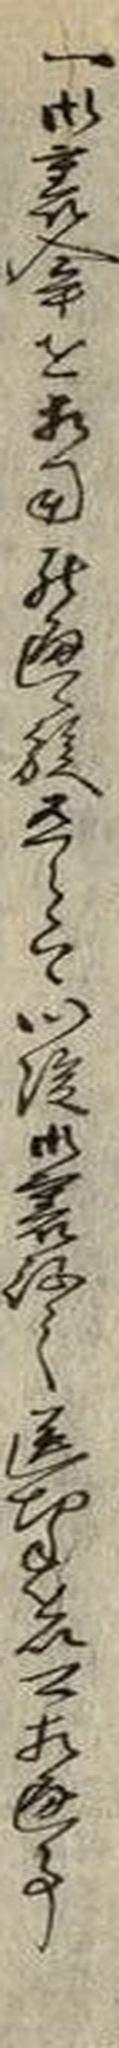一御裏傘を相用罷通候族有之候はゝい以後御裏役之送切手を以可相通候事
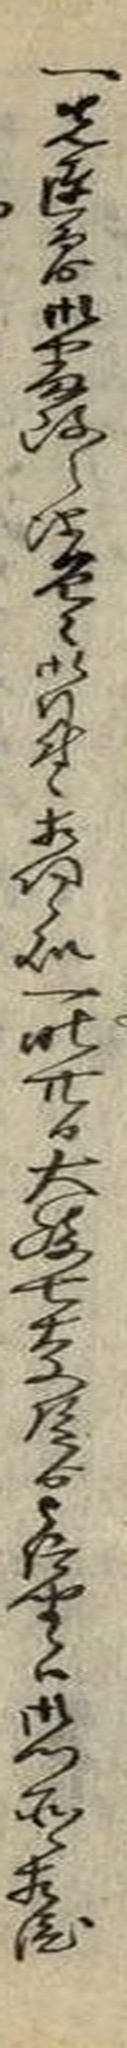一先達而御番改之儀色々御目付へ相伺候処一昨廿日大嶋七太夫殿ゟ被仰聞候は御門所へ相渡
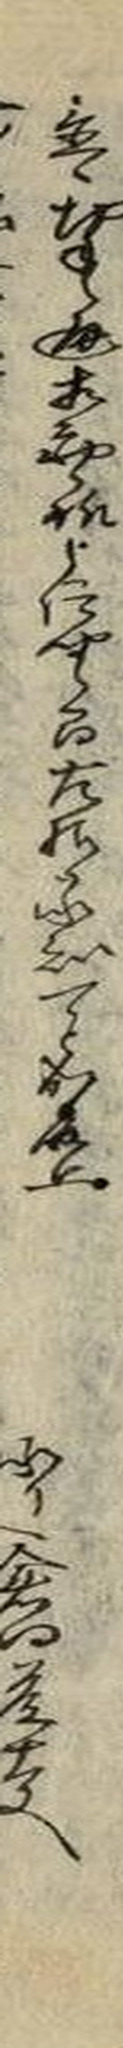置候切手之通相勤候様被仰聞候間左様御承知可被成候上
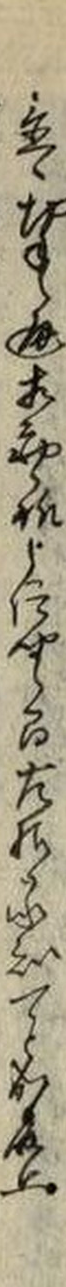置候切手之通相勤候様被仰聞候間左様御承知可被成候上
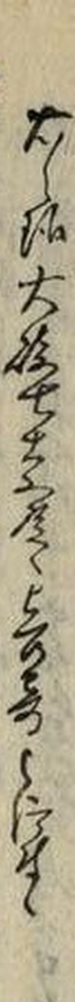右之趣大嶋七太夫殿へ被召寄被仰付候
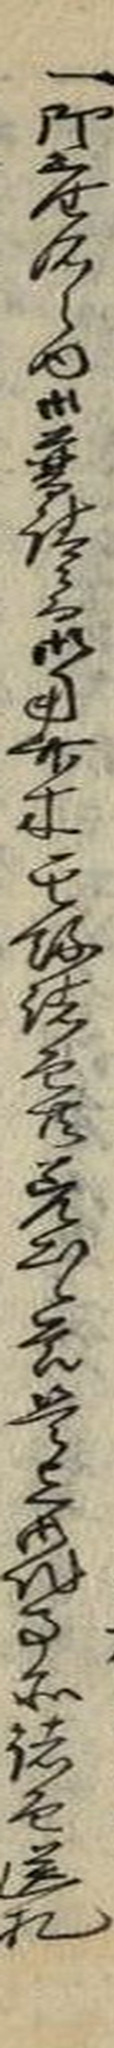一御座所之内御普請に而御用竹木其餘諸色共差出候節是迄御作事所諸色送札
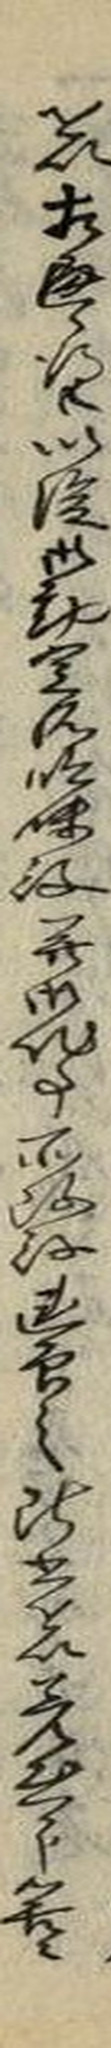を以相通候得共以後御勘定所吟味致并御作事所改役連印之断書を以差出可申筈に
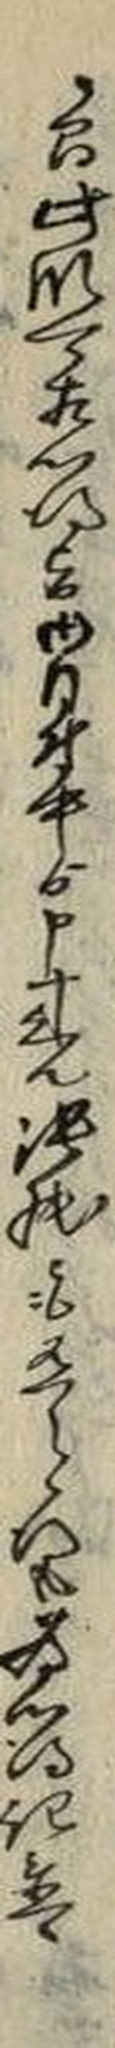候間此段可相心得候旨御目付中ゟ申来ル張紙にも有之候得共為心得記置候
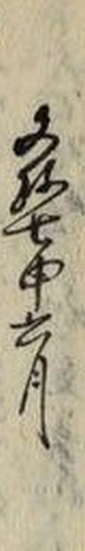文政七申六月
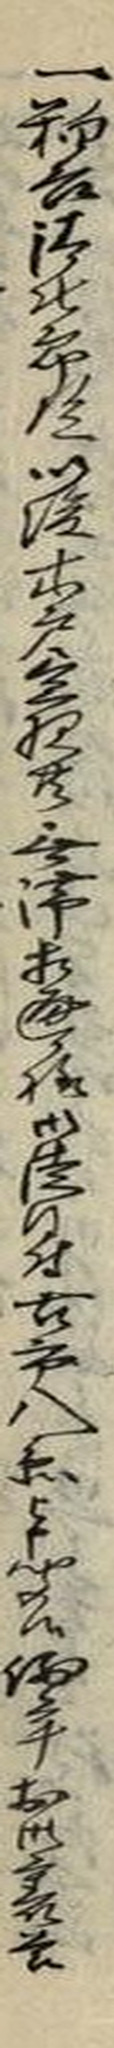一粕谷清次郎殿以後木戸昼夜共無滞相通候様御徒目付古市八兵衛被申聞候は例年於御裏節
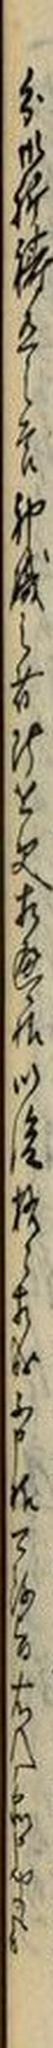分御祈祷有之節神職之者断を受相通候様以後猥に相成不申様可致旨右八兵衛被申聞候以上
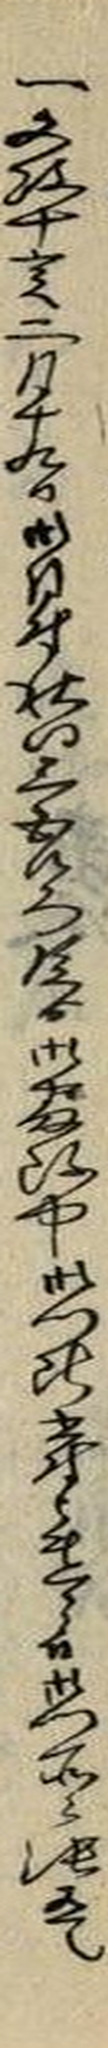一文政十亥二月十九日御目付秋田三五左衛門殿ゟ御番頭中御門断之書付被遣候に付御門所に張有之
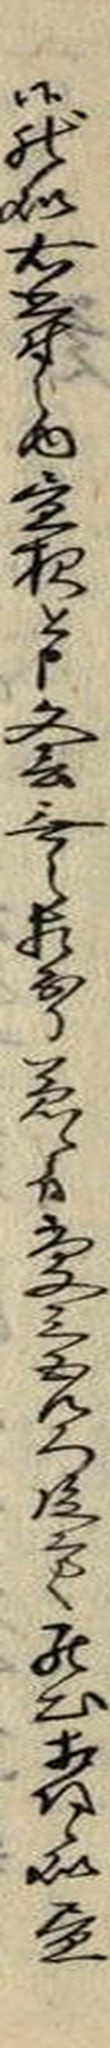候然処右書付之内昼夜と申文言無之相分り兼候付尚又三五左衛門殿方へ罷出相伺候処昼
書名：御門御櫓之部
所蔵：福井県文書館 Fukui Prefectural Archives
